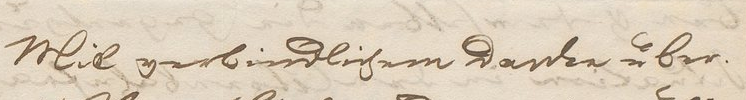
Mit verbindlichem Danke über-
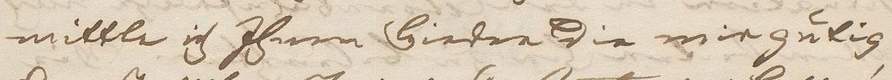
mittle ich Ihnen wieder die mir gütig
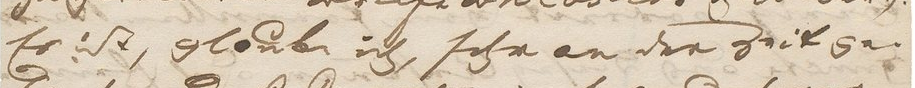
Es ist, glaube ich, sehr an der Zeit ge-
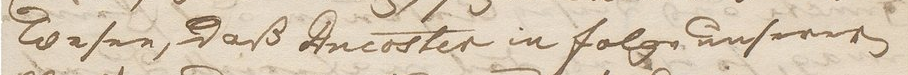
wesen, daß Ducoster in Folge unserer
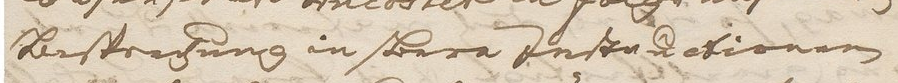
Besprechung in Bern Instructionen
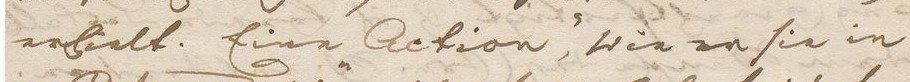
erhielt. Eine «Action», wie er sie in
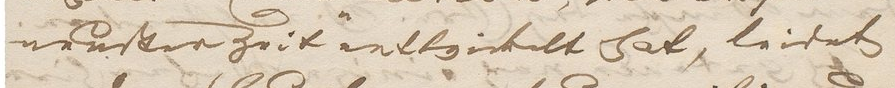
neuster Zeit entwickelt hat, leidet
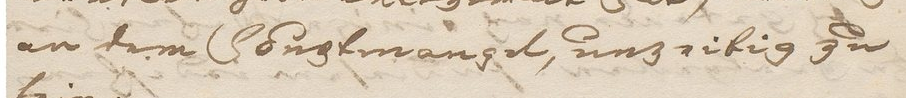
an dem Hauptmangel, unzeitig zu
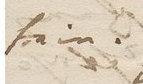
sein.
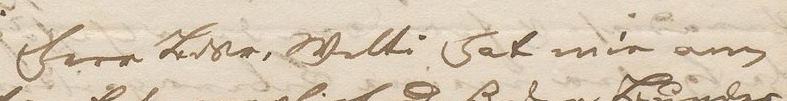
Herr Bdsr. Welti hat mir am
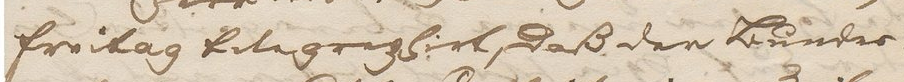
Freitag telegraphirt, daß der Bundes-
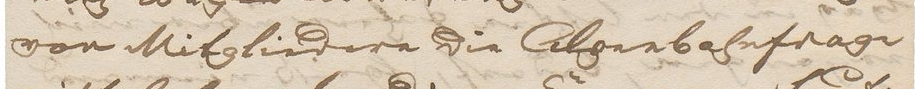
von Mitgliedern die Alpenbahnfrage
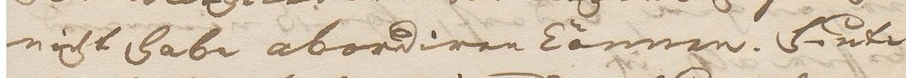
nicht habe abordiren können. Heute
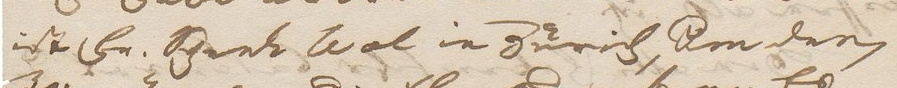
ist Hr. Schenk wol in Zürich, um den
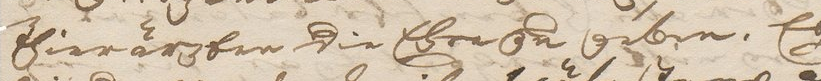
Thierärzten die Ehre zu geben. Es
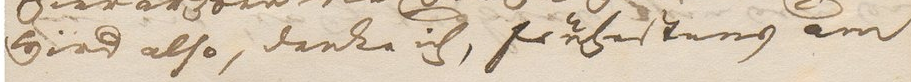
wird also, denke ich, frühestens am
